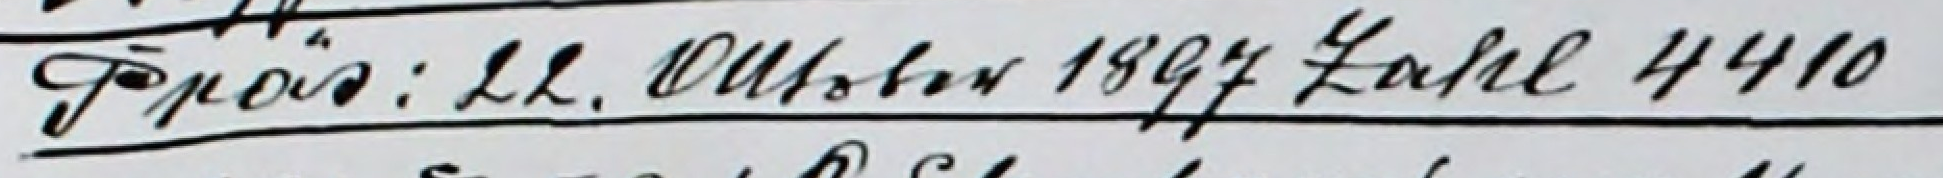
Präs: 22. Oktober 1897 Zahl 4410
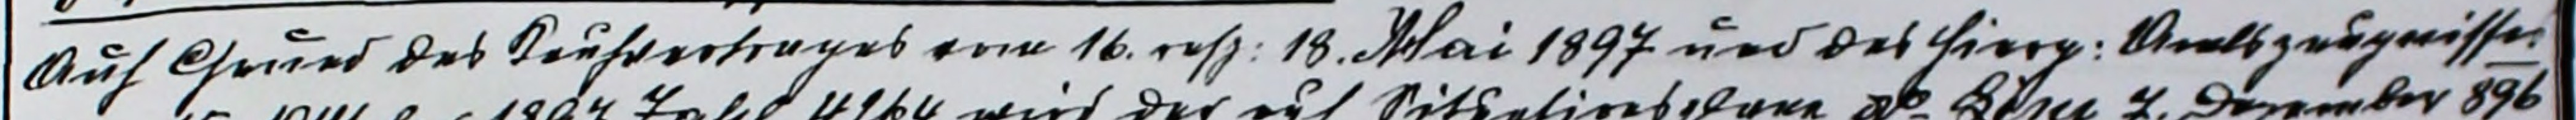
Auf Grund des Kaufvertrages vom 16. resp: 18. Mai 1897 und des hierg: Amtszeugnisses
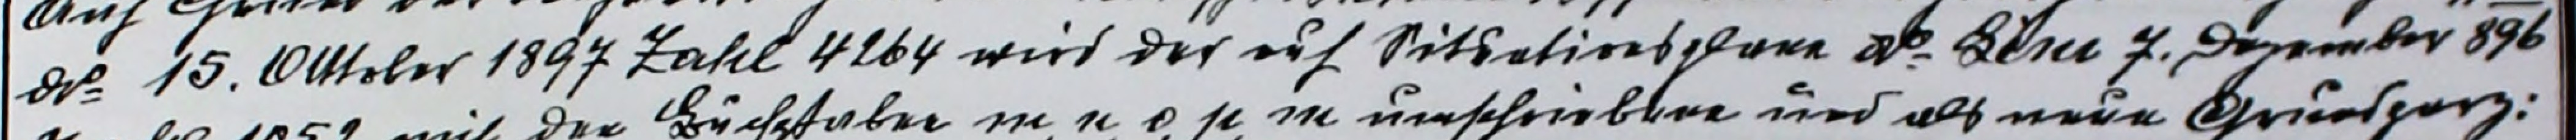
ddo 15. Oktober 1897 Zahl 4264 wird der auf Situationsplane ddo Line 7. Dezember 896
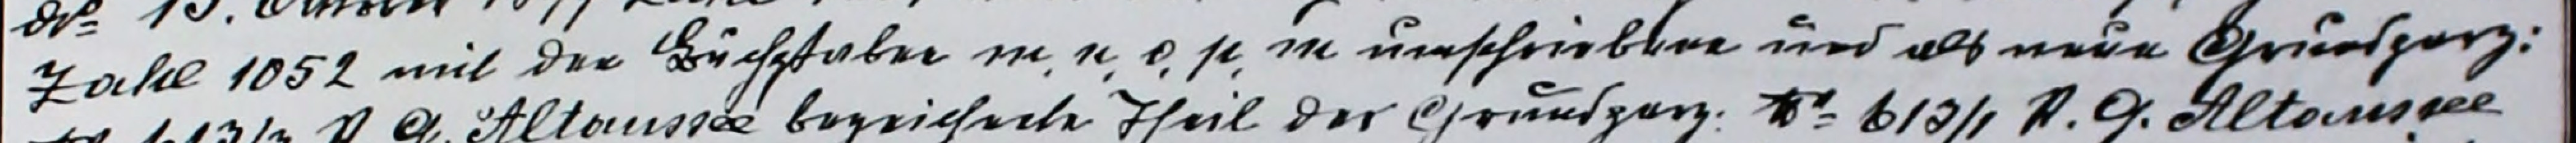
Zahl 1052 mit den Buchstaben m, n, o, p, m umschriebene und als neue Grundparz:
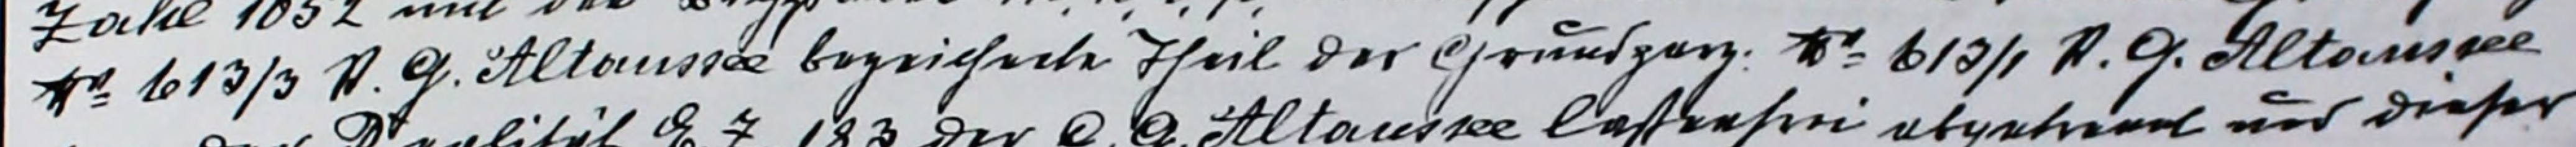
No 613/3 St.G. Altaussee bezeichnete Theil der Grundparz: No 613/1 St.G. Altaussee
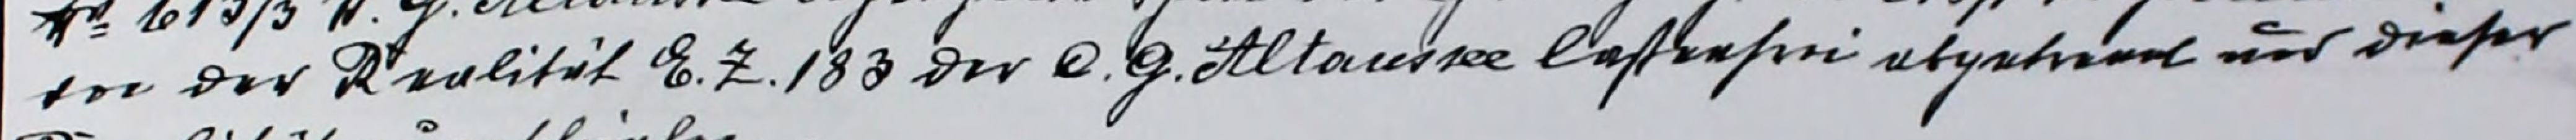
von der Realität E.Z. 183 der C.G. Altaussee lastenfrei abgetrennt und dieser
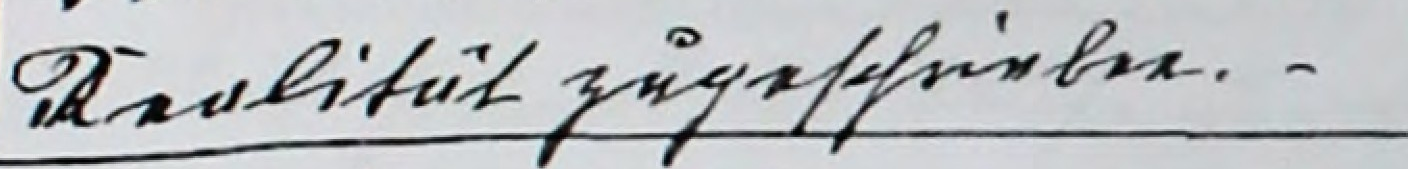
Realität zugeschrieben.-
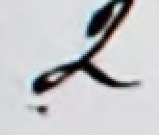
2
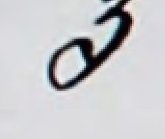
3
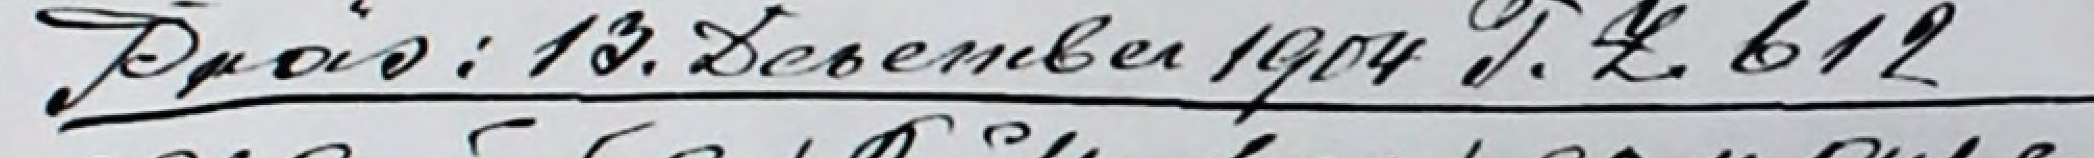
Präs: 13. December 1904 T.Z. 612
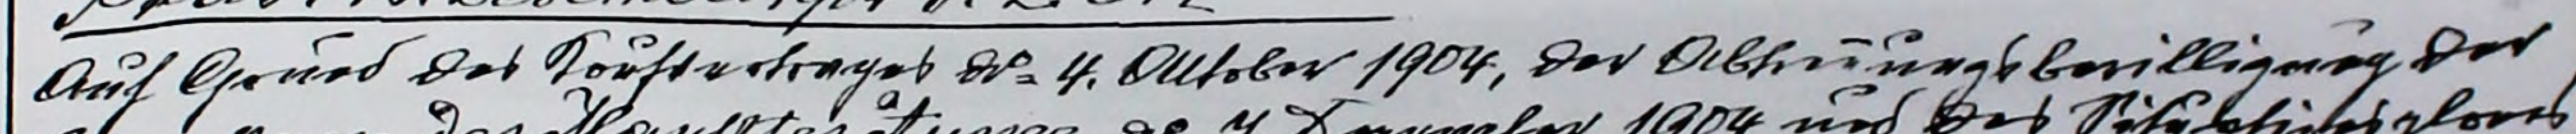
Auf Grund des Kaufvertrages ddo 4. Oktober 1904, der Abtrennungsbewilligung der
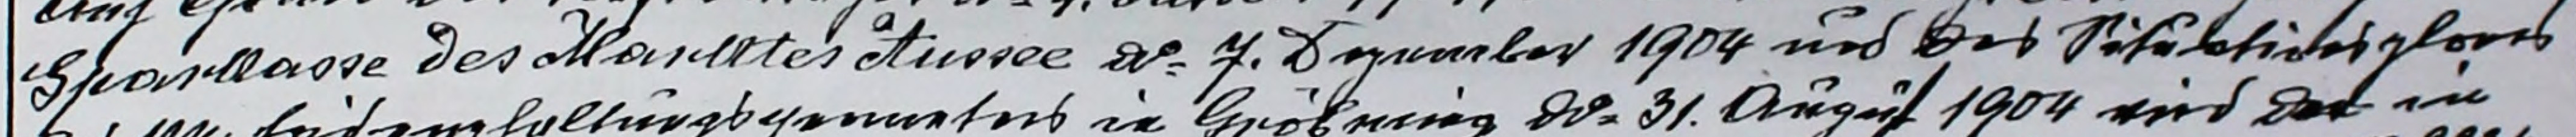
Sparlasse des Marktes Aussee ddo 7. Dezember 1904 und des Situationsplanes
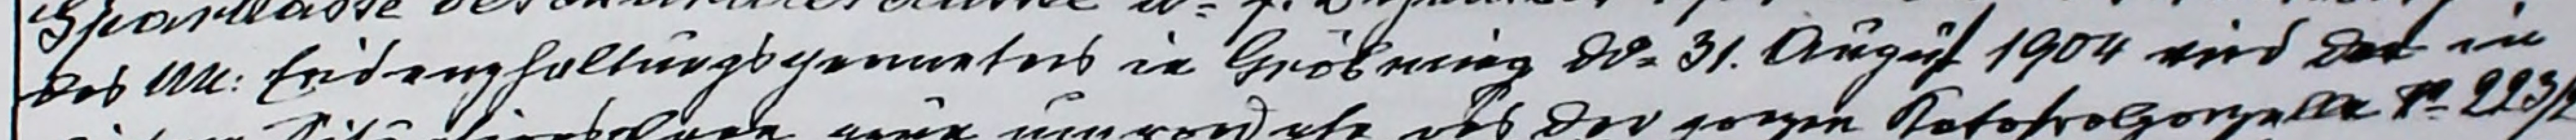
des Uk: Evidenzhaltungsgeometers in Gröbming ddo 31. August 1904 wird das in
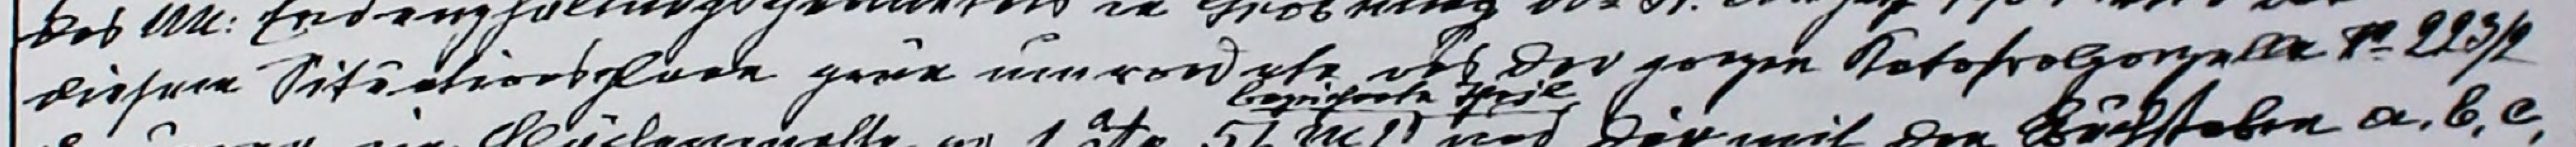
diesem Situationsplane grun umvordate ves der parzen Katofrolparzelle No 223/2
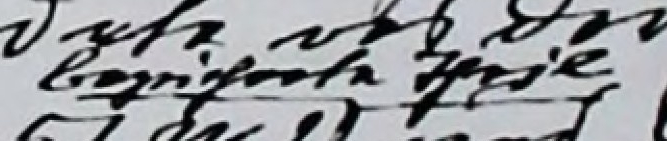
bezeichnete Theil
